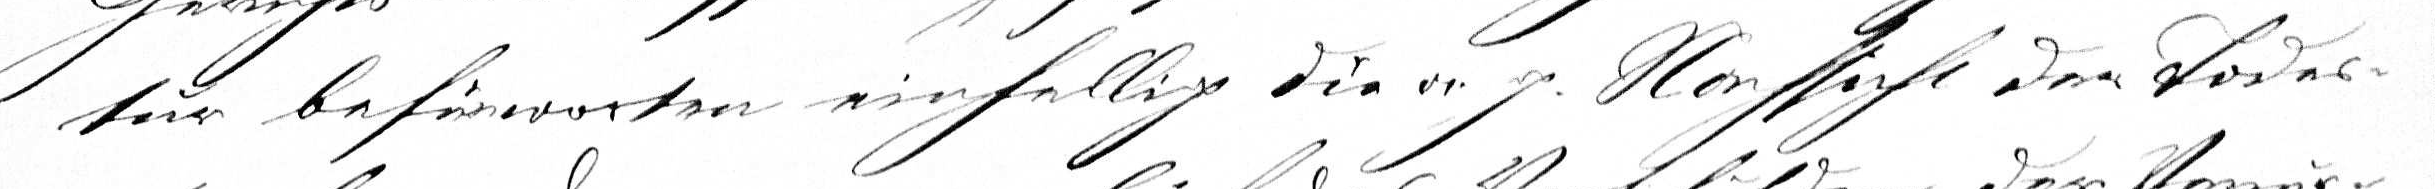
tur befürworten einhellig die a. g. Nachsicht der Todes¬
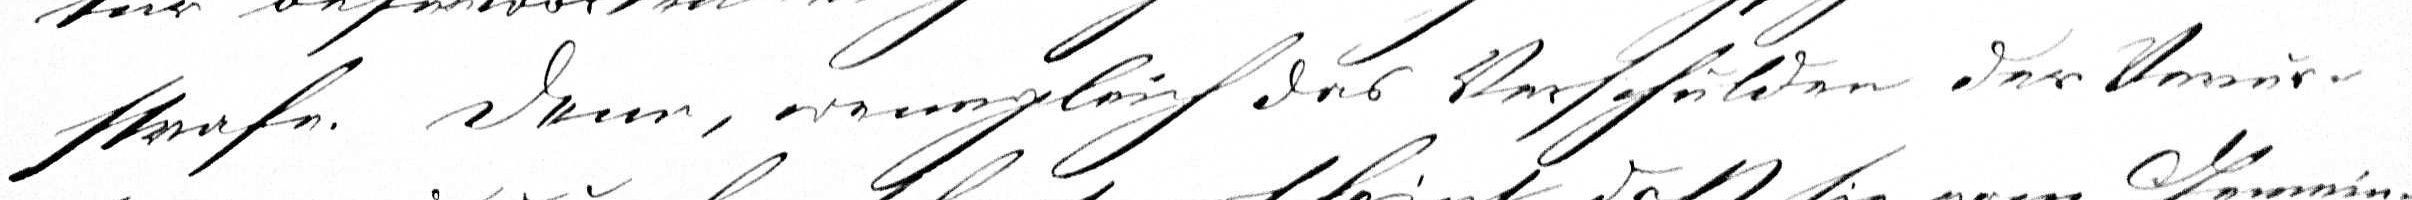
strafe. Denn, wenngleich das Verschulden der Verur¬
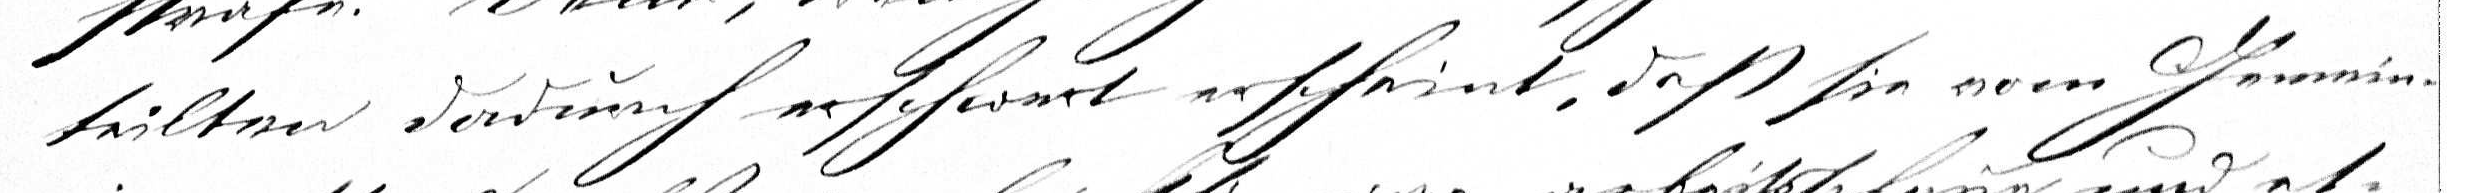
teilten dadurch erschwert erscheint, daß sie vom Gemein¬
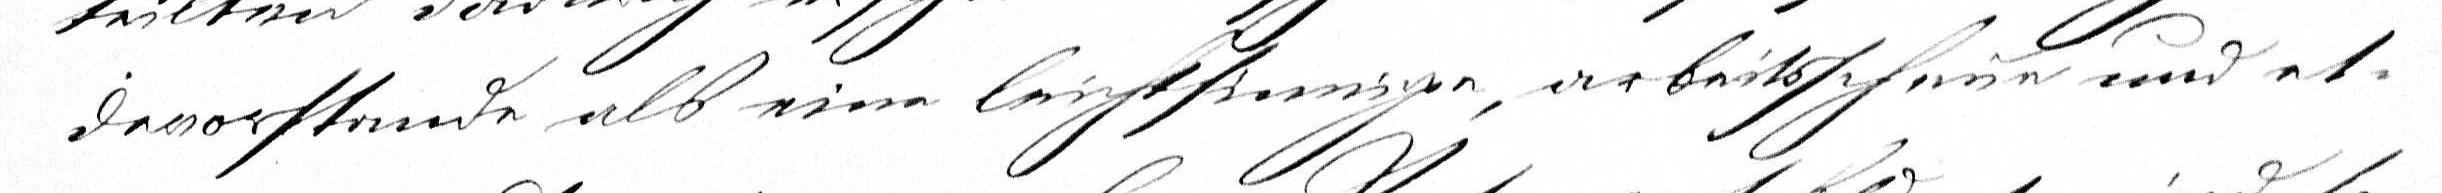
devorstande als eine leichtsinnige, arbeitsscheue und et¬
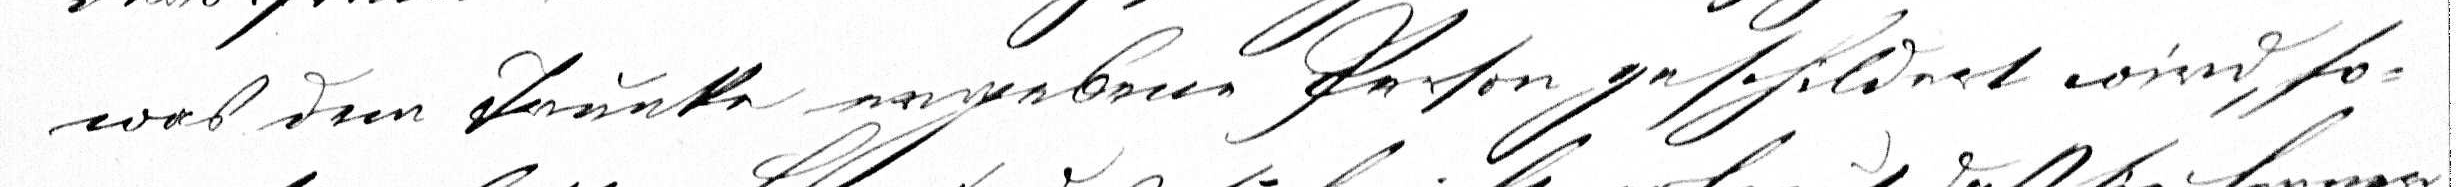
was dem Trunke ergebene Person geschildert wird, so¬
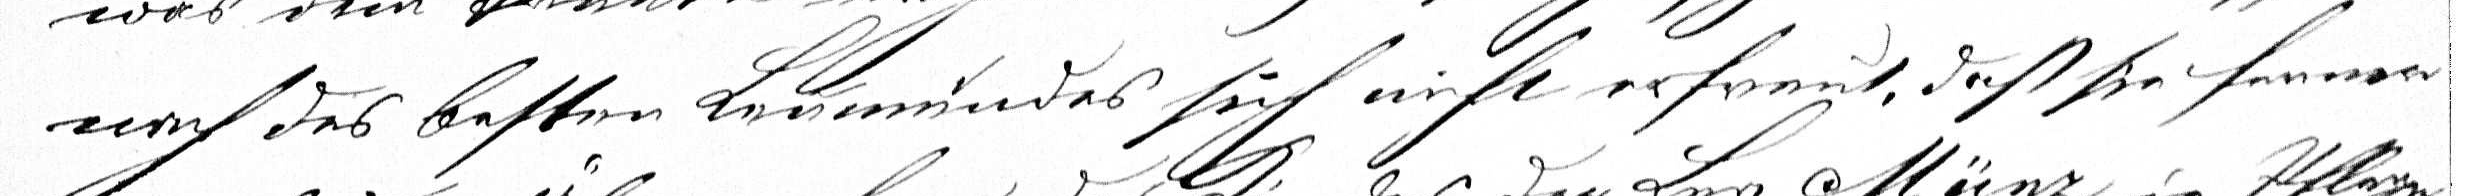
nach des besten Leumundes sich nicht erfreut, daß sie ferner
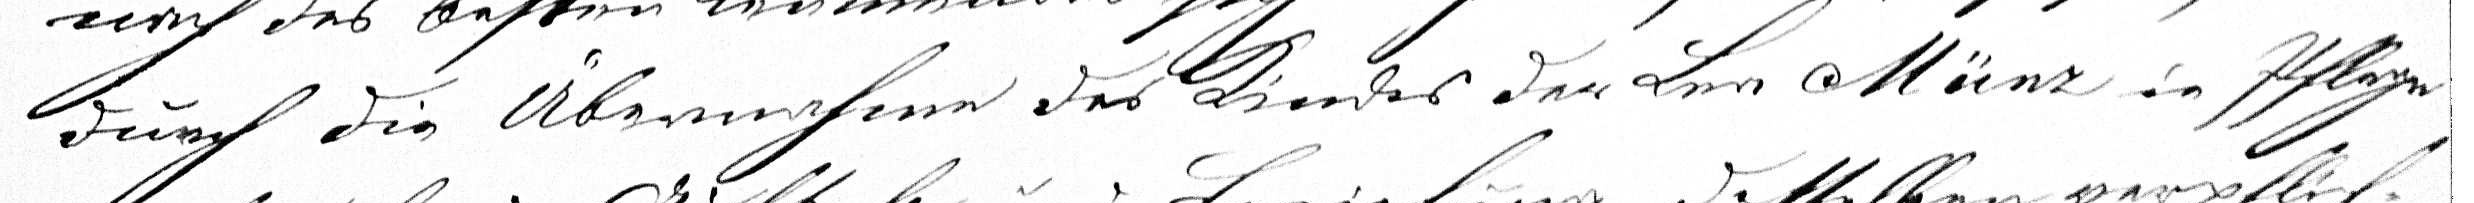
durch die Übernahme des Kindes der Lea Münz in Pflege
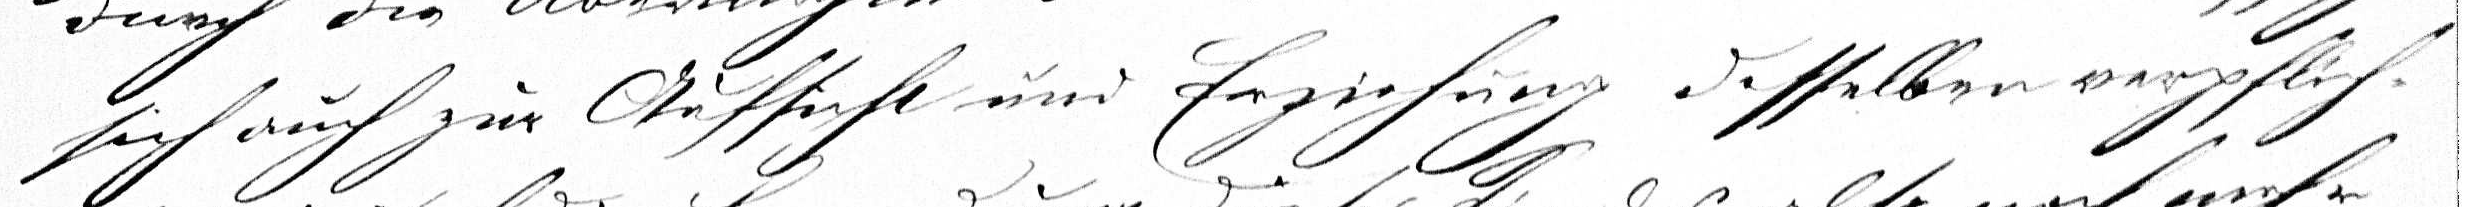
sich auch zur Aufsicht und Erziehung desselben verpflich¬
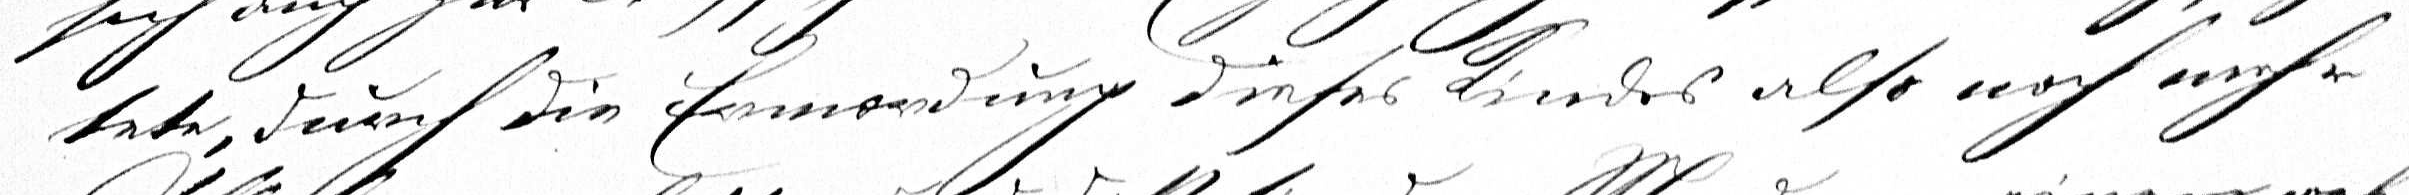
tete, durch die Ermordung dieses Kindes also noch mehr
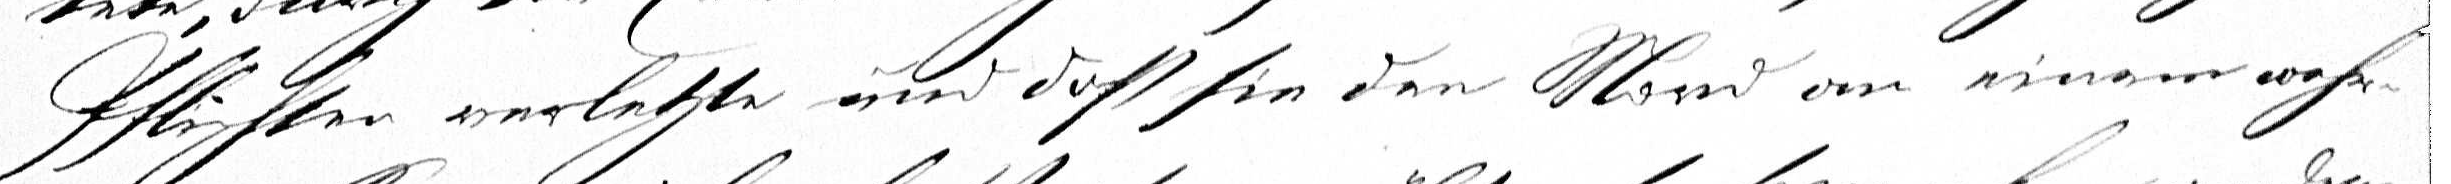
Pflichten verletzte und daß sie den Mord an einem wehr¬
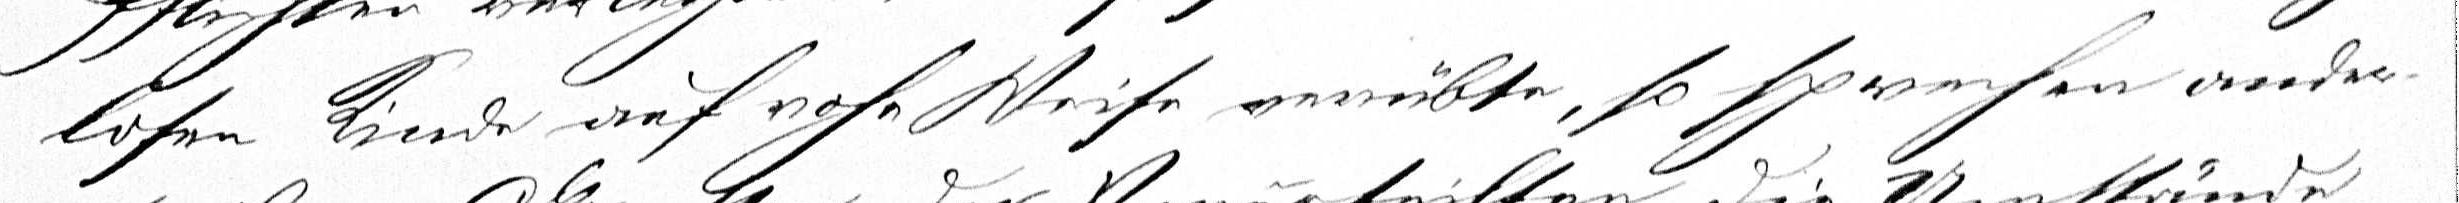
losen Kinde auf rohe Weise verübte, so sprechen ander¬
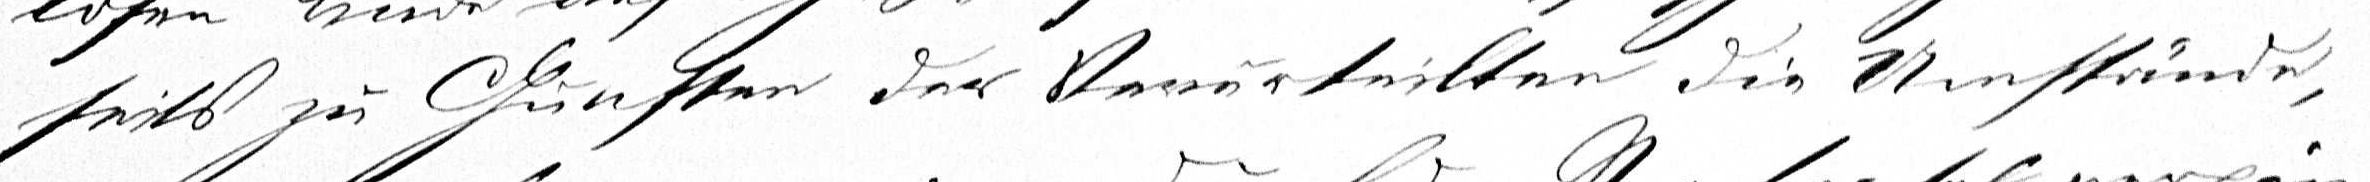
seits zu Gunsten der Verurteilten die Umstände,
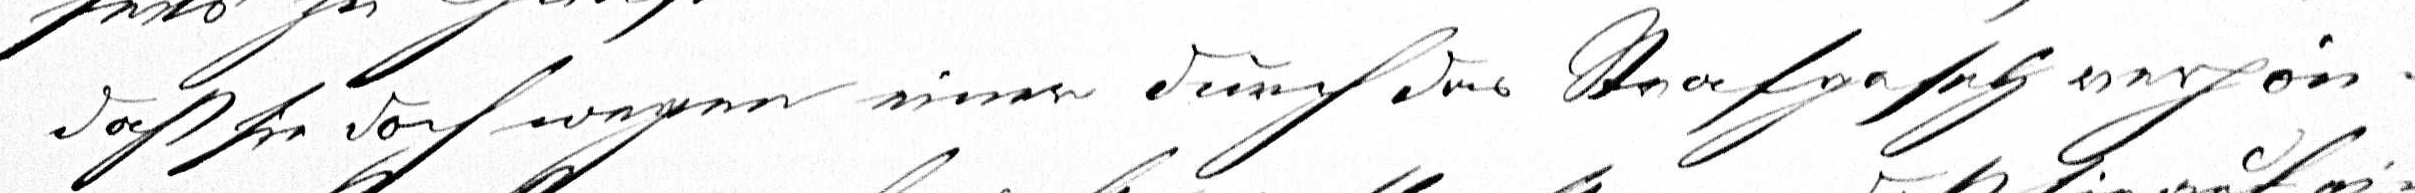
daß sie doch wegen einer durch das Strafgesetz verpön¬
